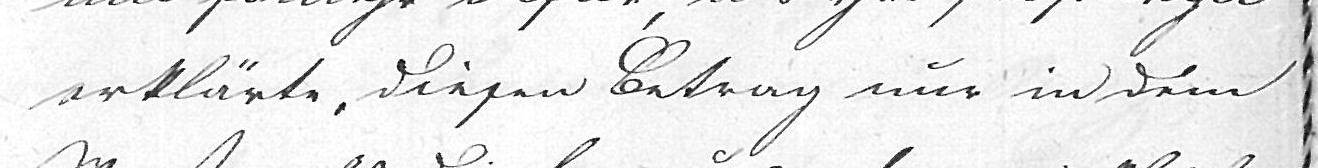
erklärte, diesen Betrag nur in dem
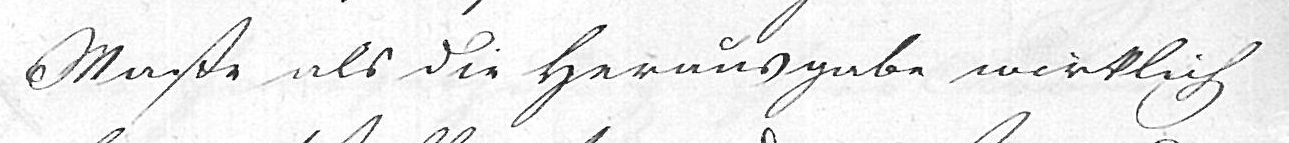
Maße als die Herausgabe wirklich
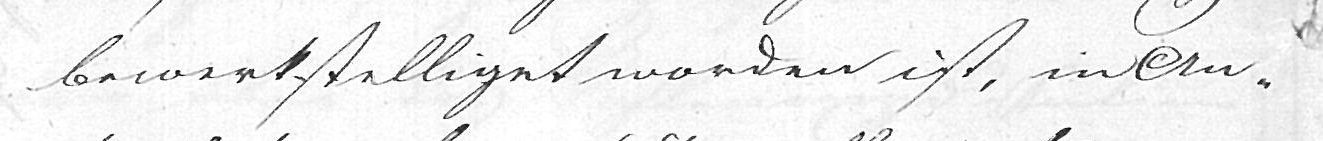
bewerkstelliget worden ist, in An-
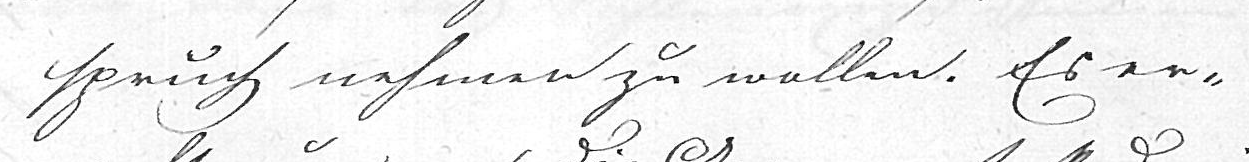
spruch nehmen zu wollen. Es er-
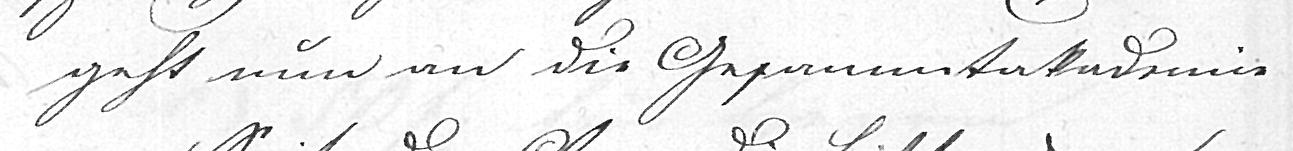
geht nun an die Gesammtakademie
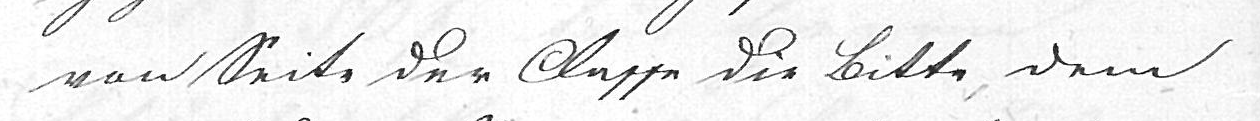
von Seite der Classe die Bitte, dem
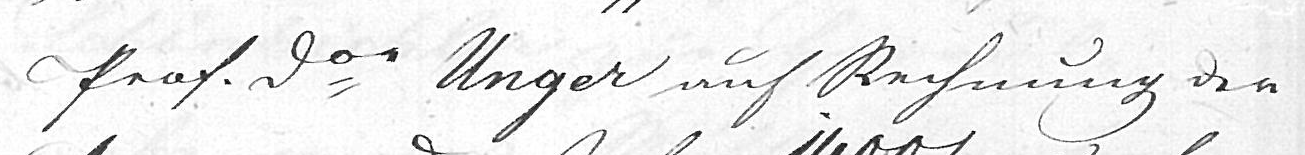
Prof. Dor Unger auf Rechnung der
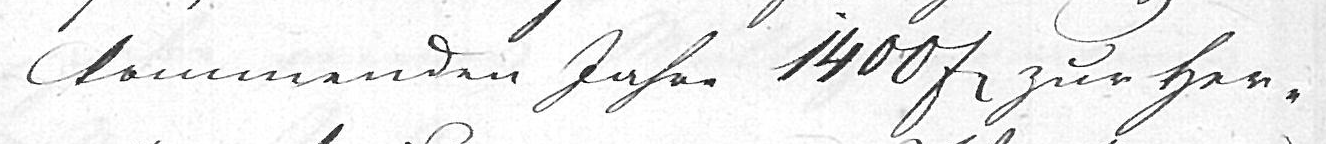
kommenden Jahre 1400 fl zur Her-
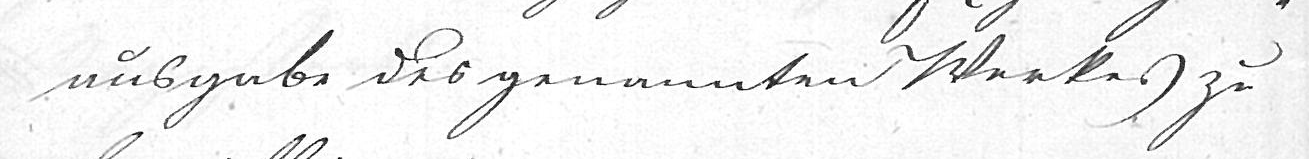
ausgabe des genannten Werken zu
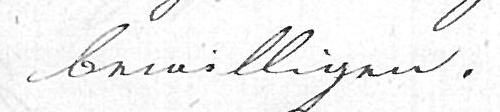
bewilligen.
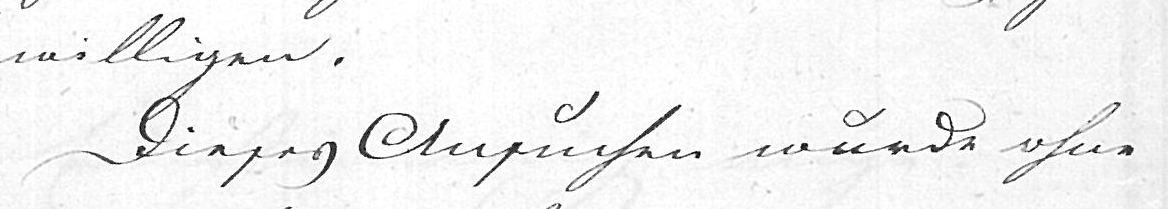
Dieses Ansuchen wurde ohne
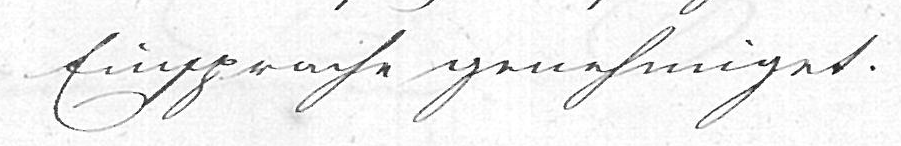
Einsprache genehmiget.
